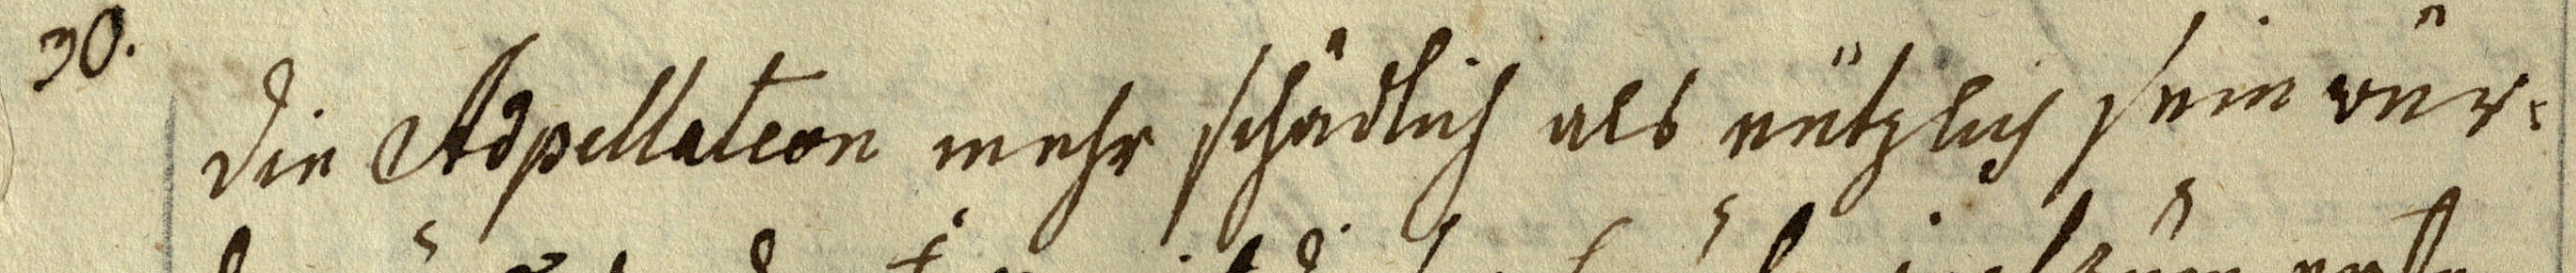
die Adpellateon mehr schädlich als nützlich sein wür¬
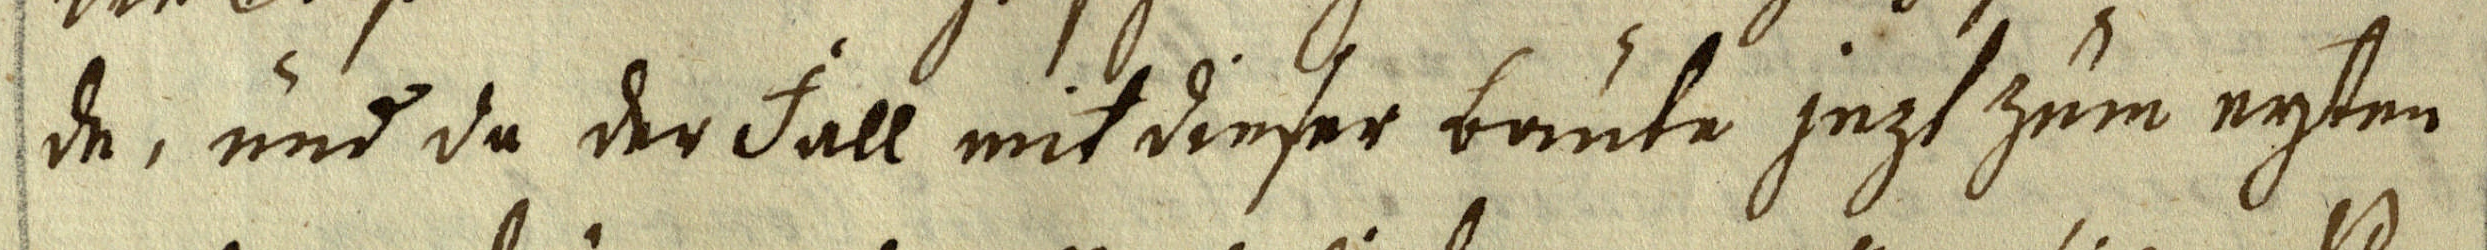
de, und da der Fall mit dieser Baute jezt zum ersten
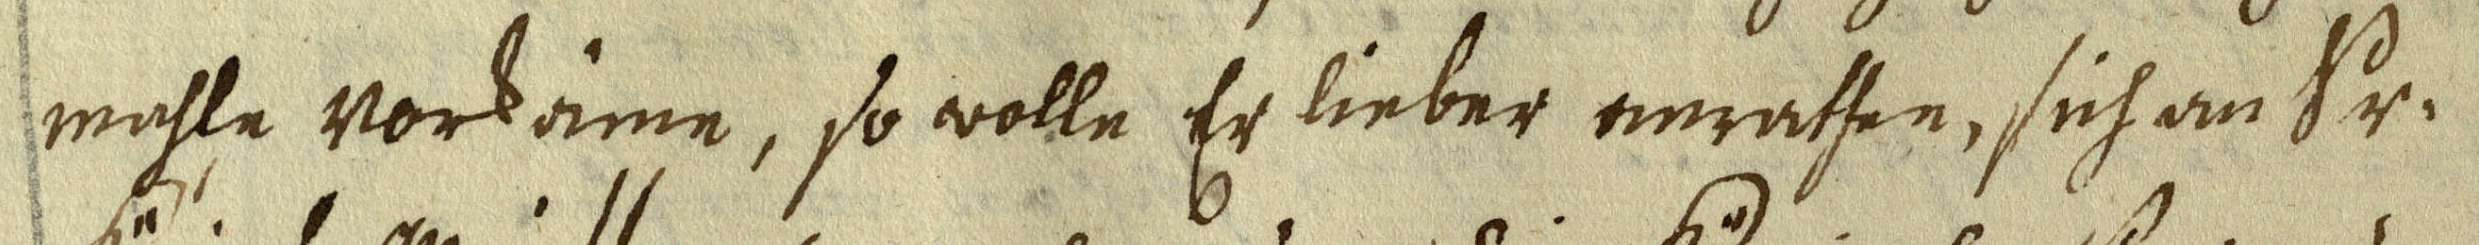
mahle vorkäme, so wolle Er lieber anrathen, sich an Sr
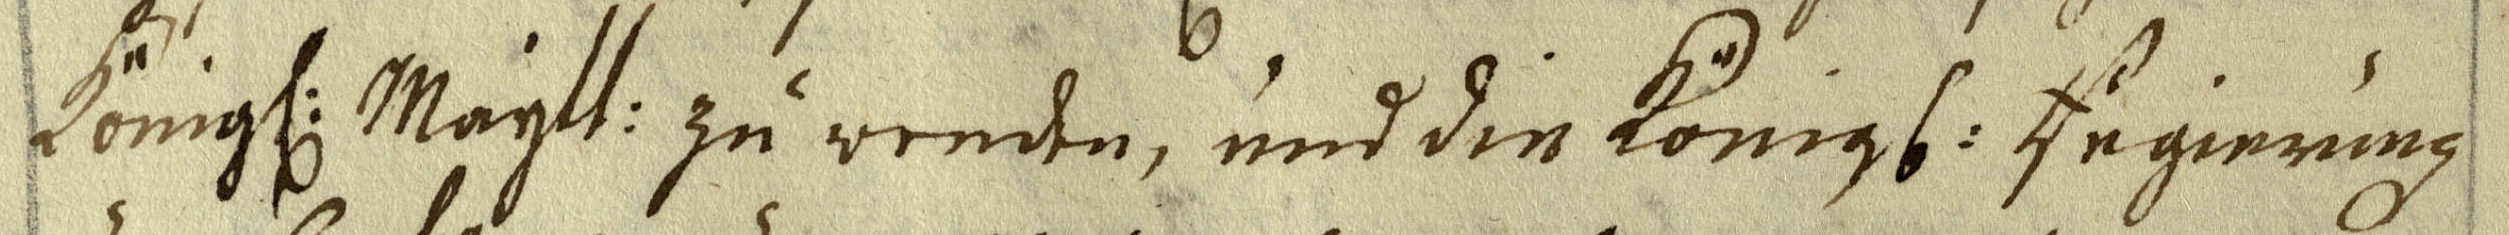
Königl Maÿtt. zu wenden, und die Königl. Regierung
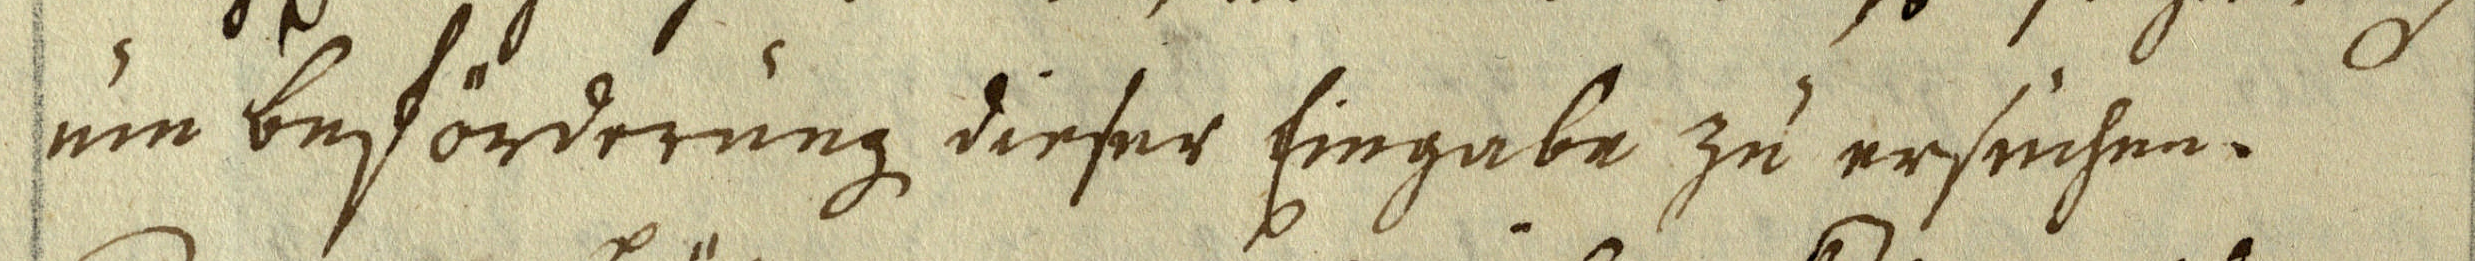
um Beförderung dieser Eingabe zu ersuchen.
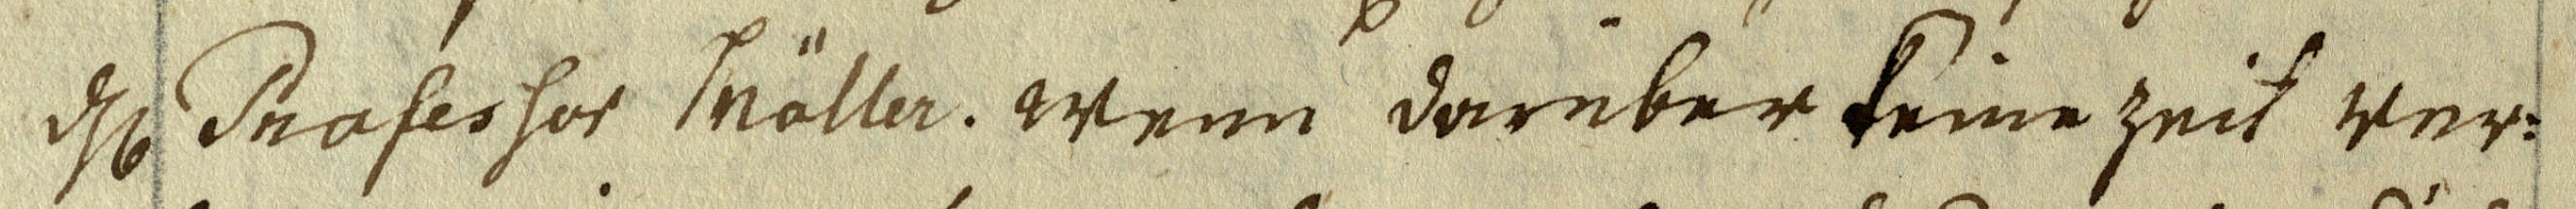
dh Professor Möller. Wenn darüber keine zeit ver¬
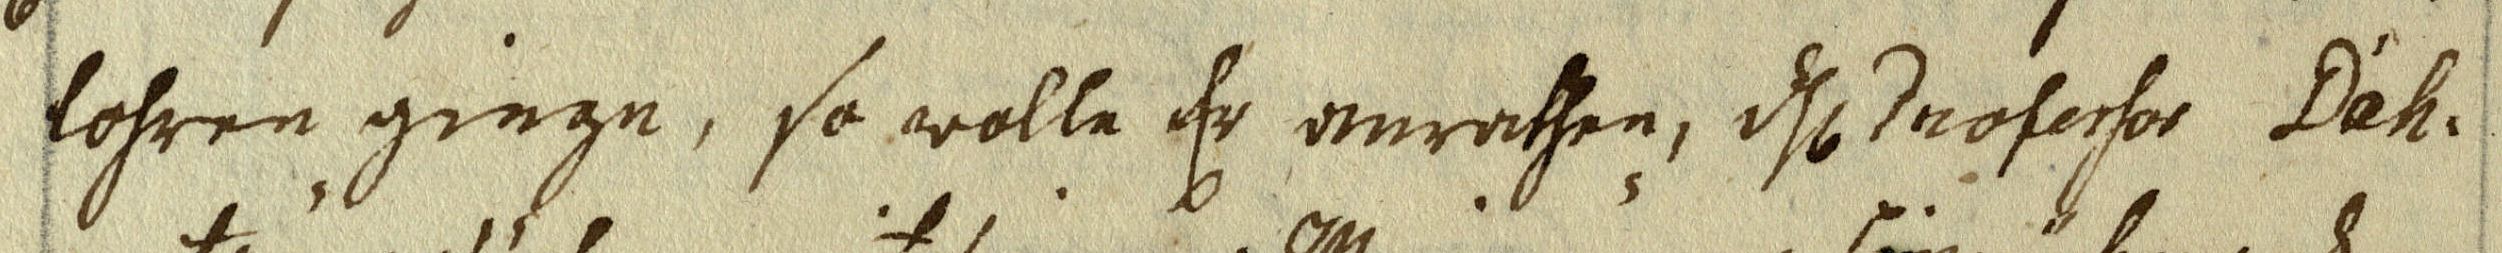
lohren ginge, so wolle Er anrathen, dh Professor Däh¬
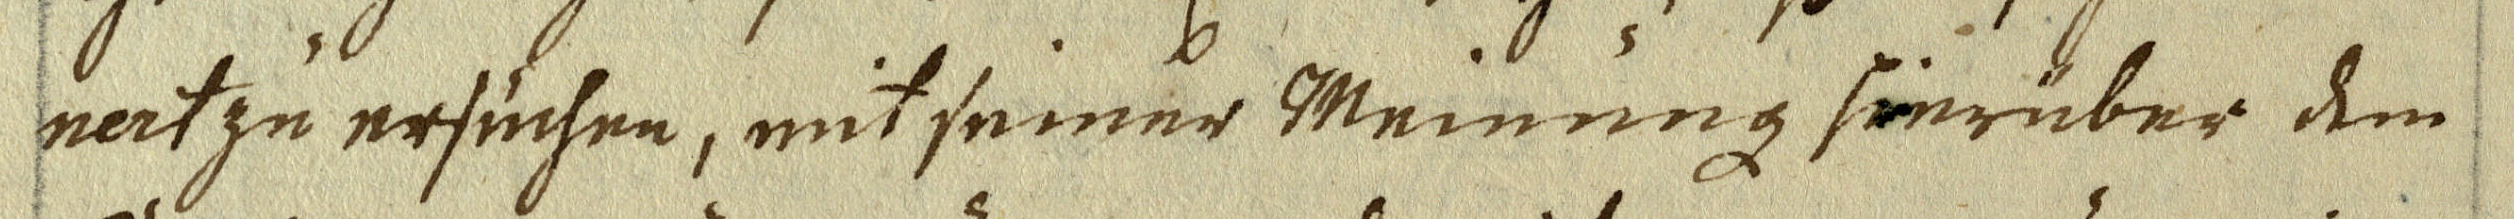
nert zu ersuchen, mit seiner Meinung hierüber dem
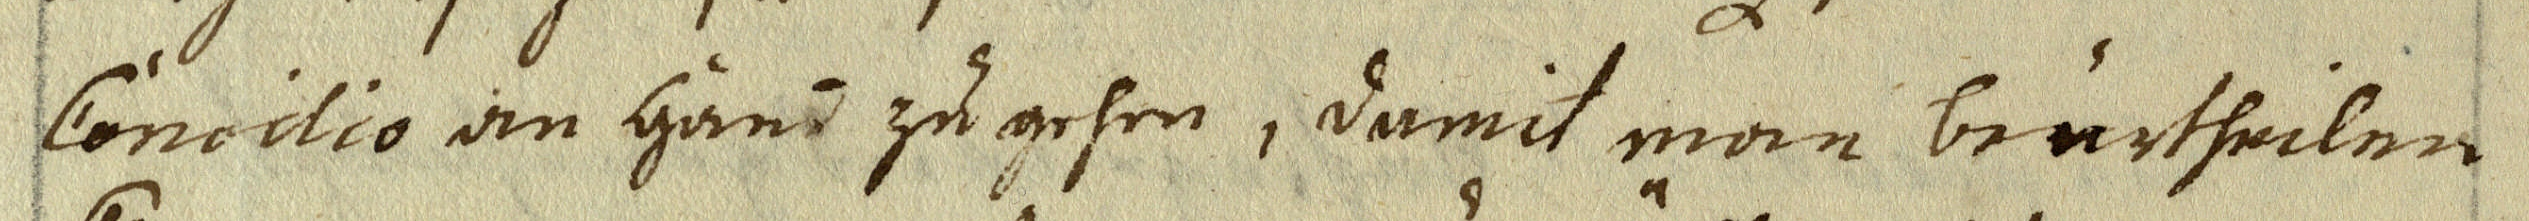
Concilio an Hand zu gehen, damit man beurtheilen
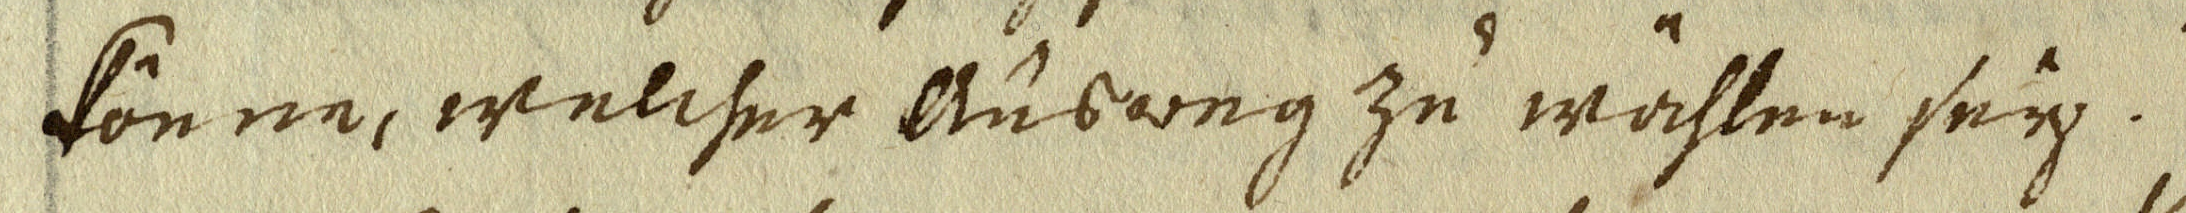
könne, welcher Ausweg zu wählen seÿ.
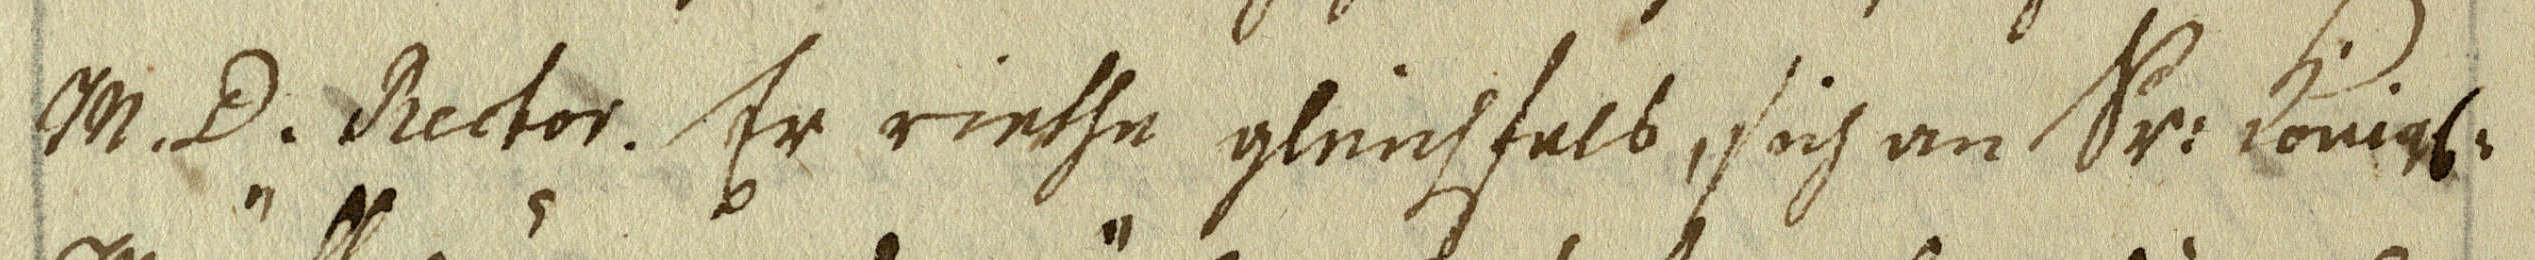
M. D. Rector. Er riethe gleichfals, sich an Sr Königl.
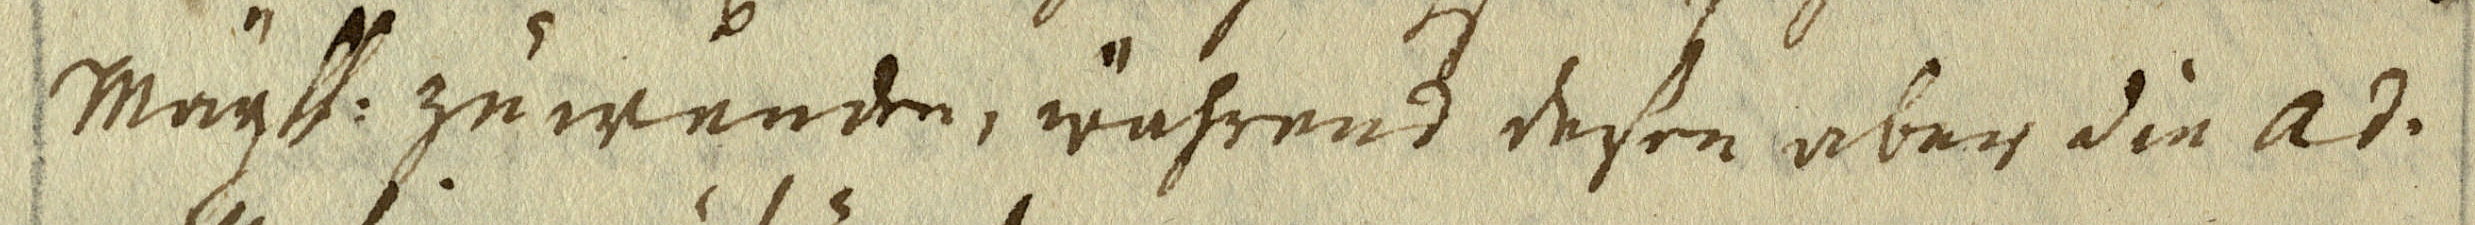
Maÿtt. zu wenden, während deßen aber die Ad¬
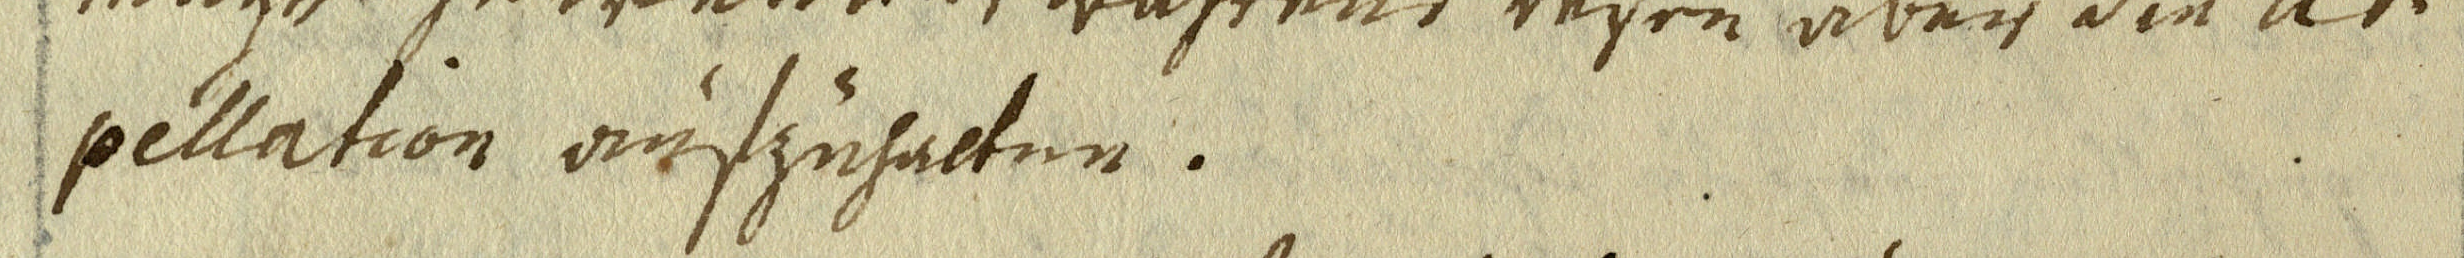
pellation aufzuhalten.
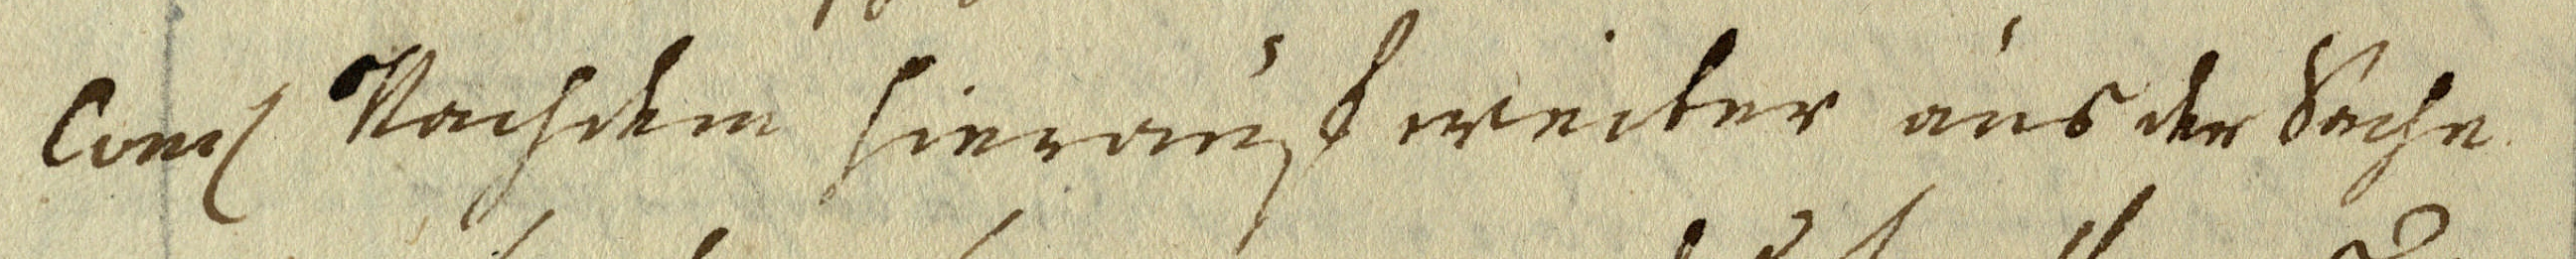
Concl. Nachdem hierauf weiter aus der Sache
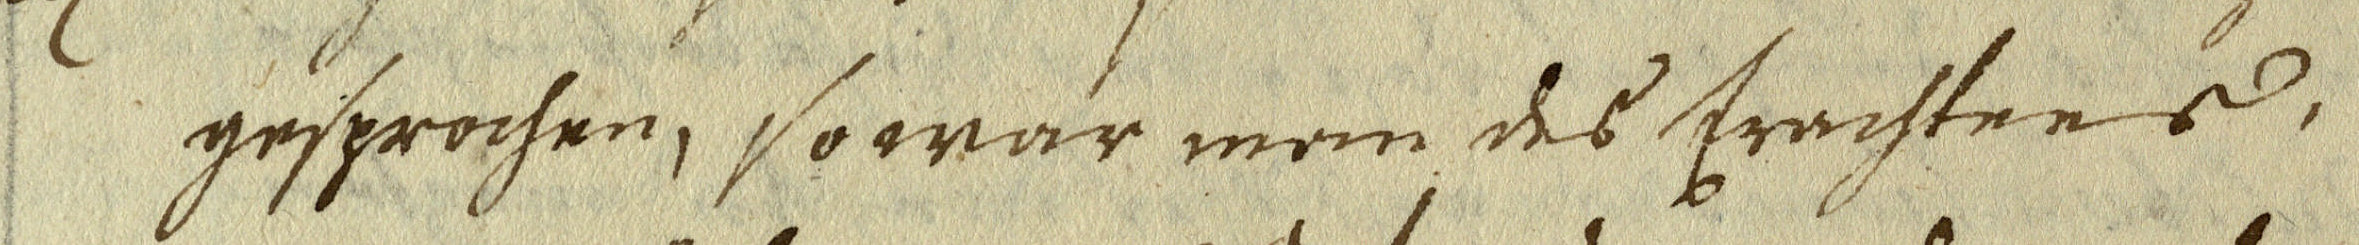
gesprochen, so war man des Erachtens,
